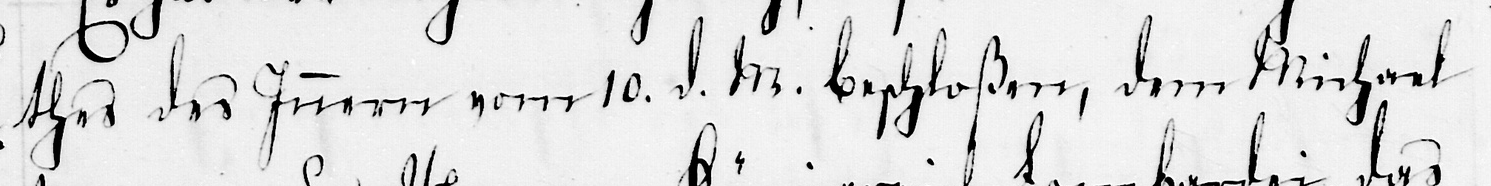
thes des Innern vom 10. d. M. beschloßen, dem Michael
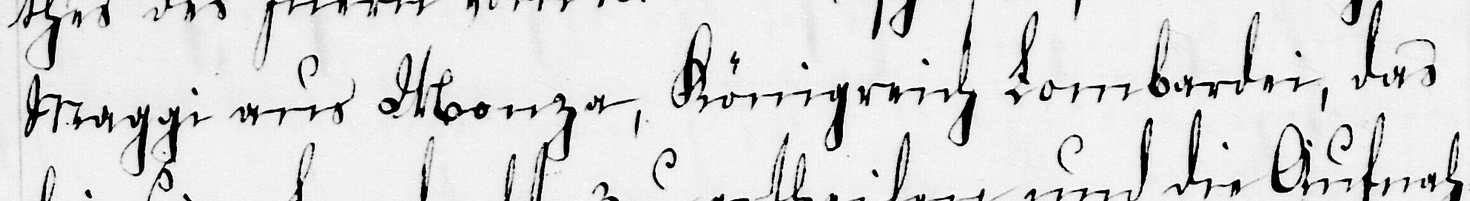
Maggi aus Monza, Königreich Lombardei, das
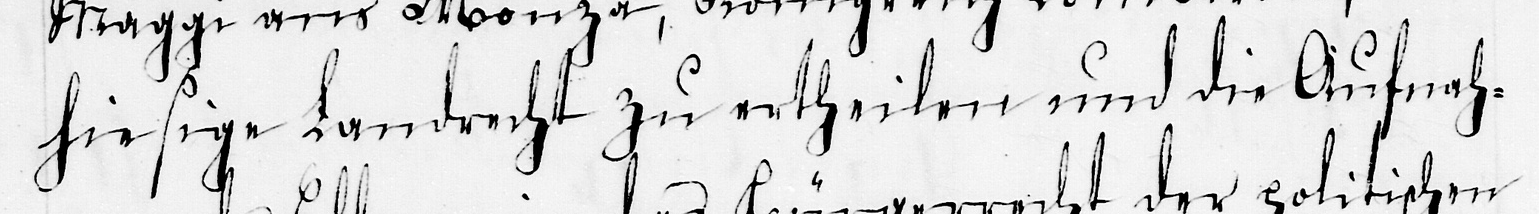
hiesige Landrecht zu ertheilen und die Aufnah¬
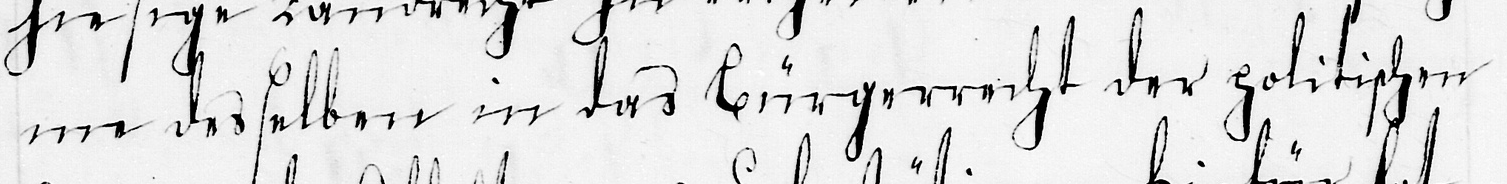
me desselben in das Bürgerrecht der politischen
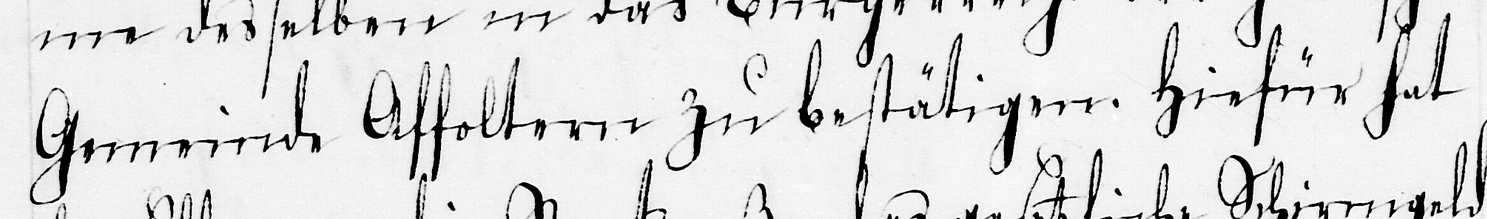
Gemeinde Affoltern zu bestätigen. Hiefür hat
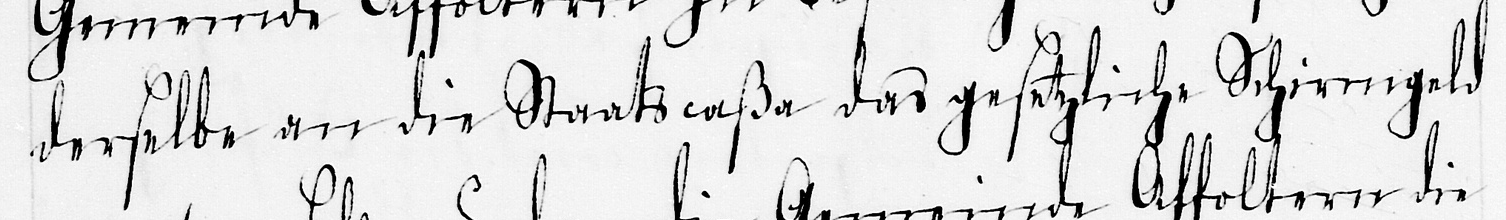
derselbe an die Staatscaßa das gesetzliche Schirmgeld
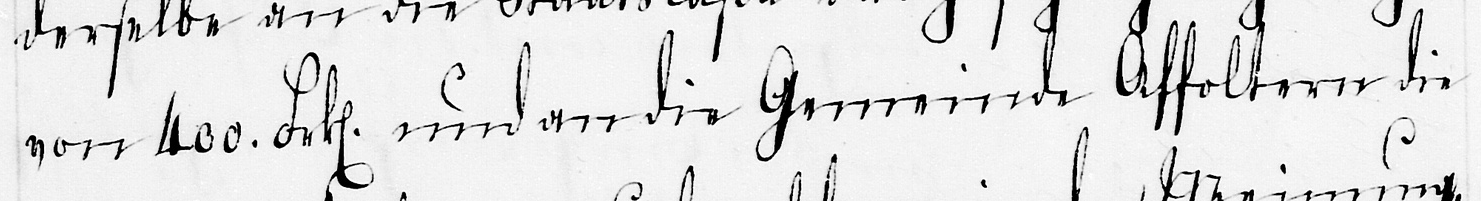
von 400. Frk[en]. und an die Gemeinde Affoltern die
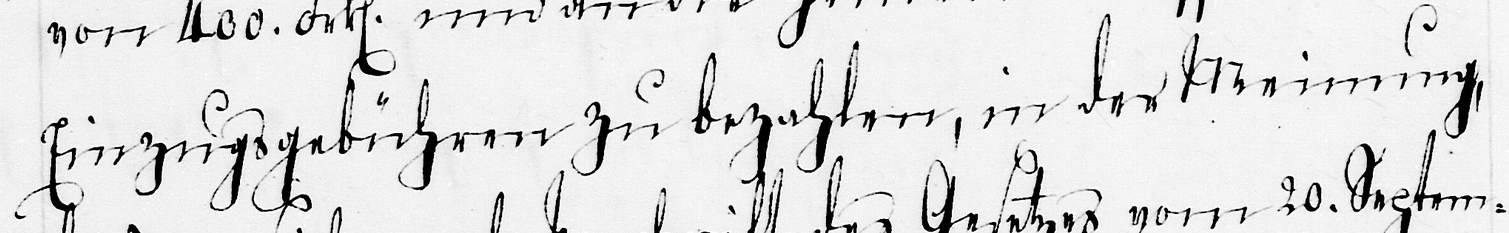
Einzugsgebühren zu bezahlen, in der Meinung,
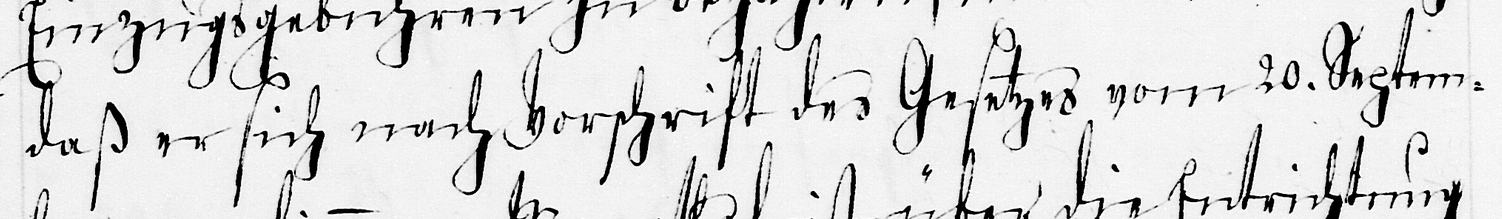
daß er sich nach Vorschrift des Gesetzes vom 20. Septem¬
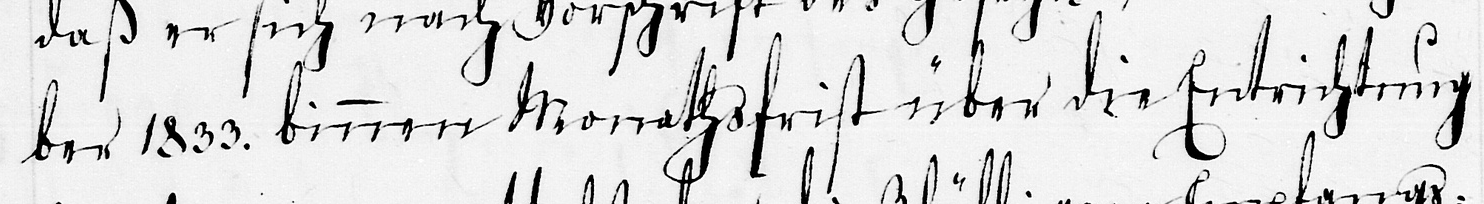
ber 1833. binnen Monathsfrist über die Entrichtung
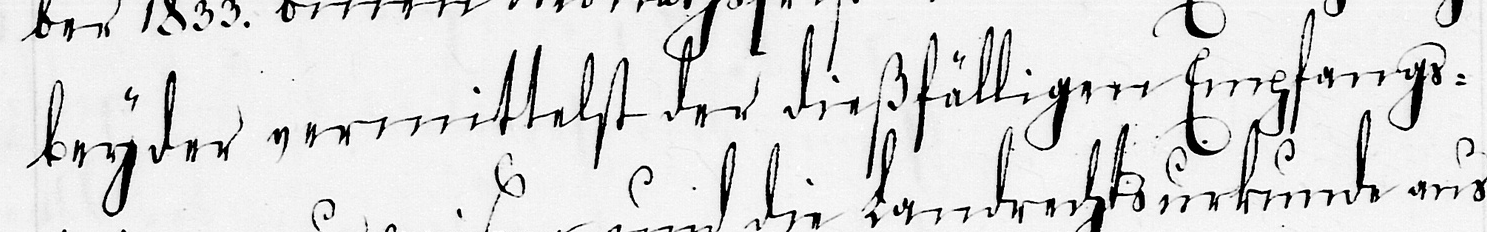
beyder vermittelst der dießfälligen Empfangs¬
